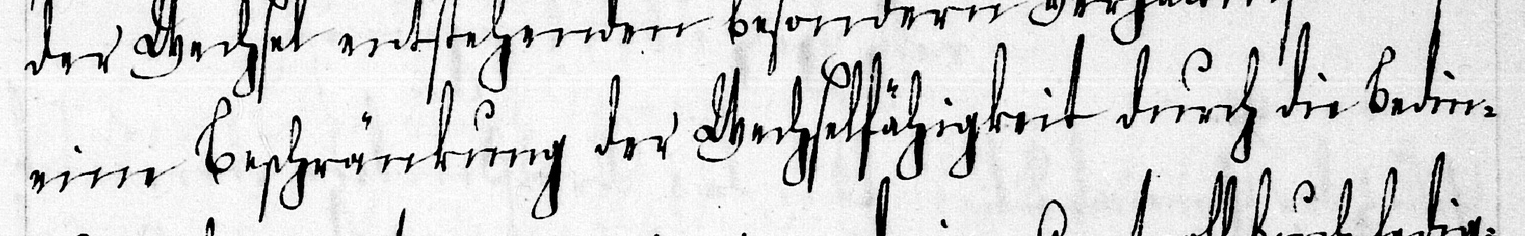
eine Beschränkung der Wechselfähigkeit durch die Bedin¬
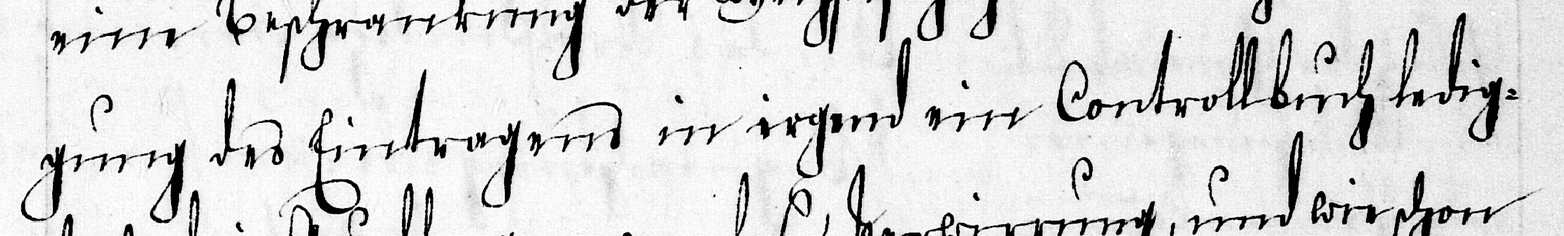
gung des Eintragens in irgend ein Controllbuch ledig¬
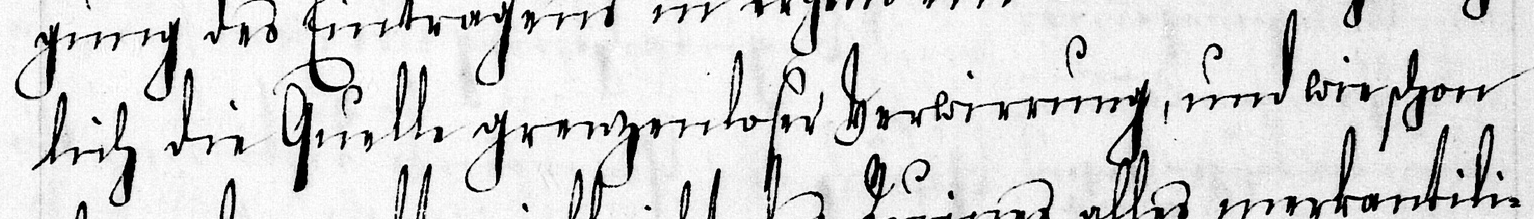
lich die Quelle grenzenloser Verwirrung, und wie schon
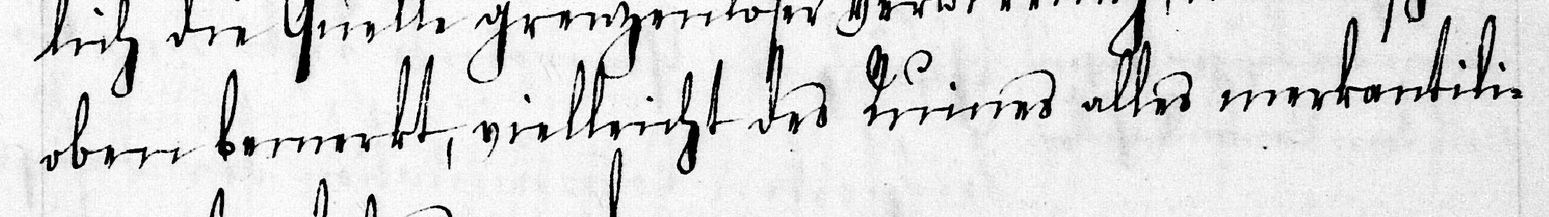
oben bemerkt, vielleicht des Ruines alles merkantili¬
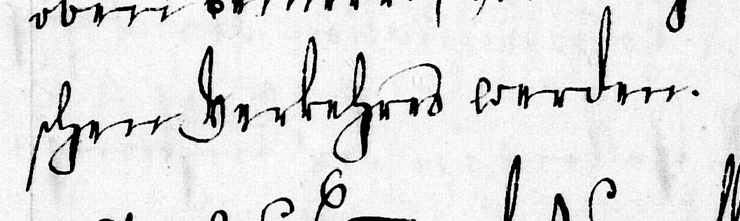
schen Verkehres werden.
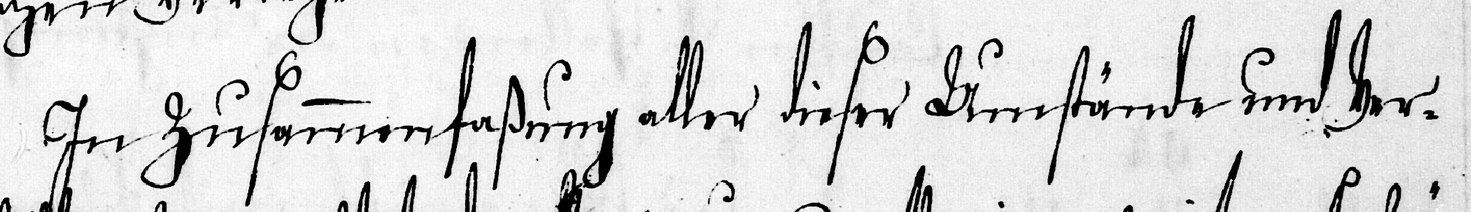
In Zusammenfaßung aller dieser Umstände und Ver¬
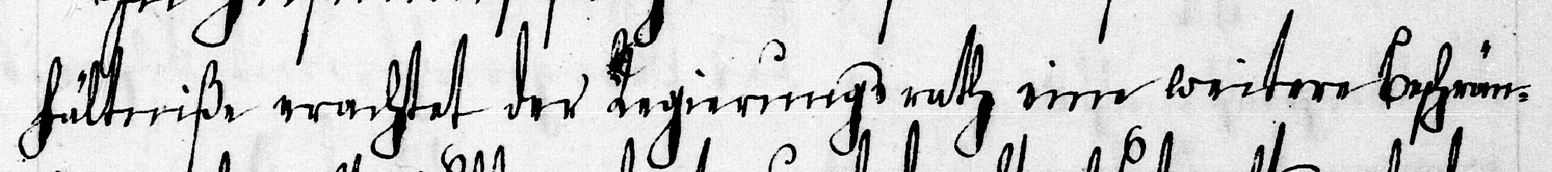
hältniße erachtet der Regierungsrath eine weitere Beschrän¬
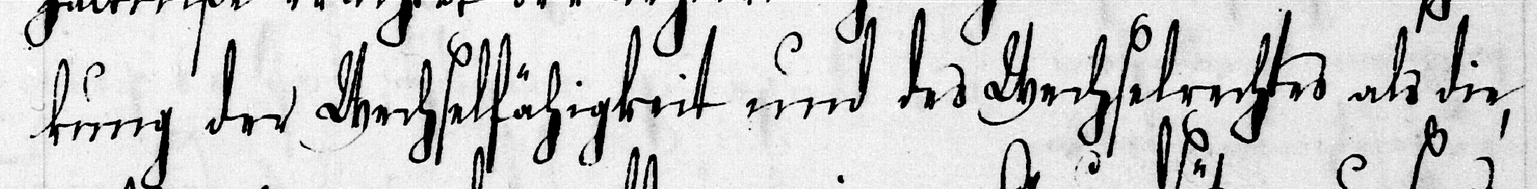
kung der Wechselfähigkeit und des Wechselrechtes als di¬
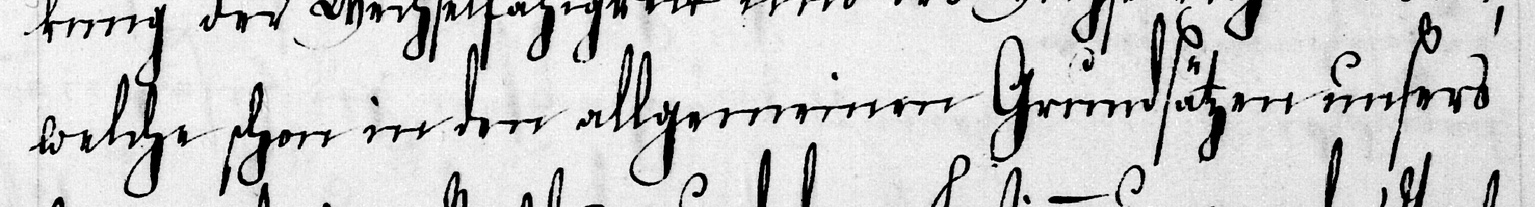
welche schon in den allgemeinen Grundsätzen unsers
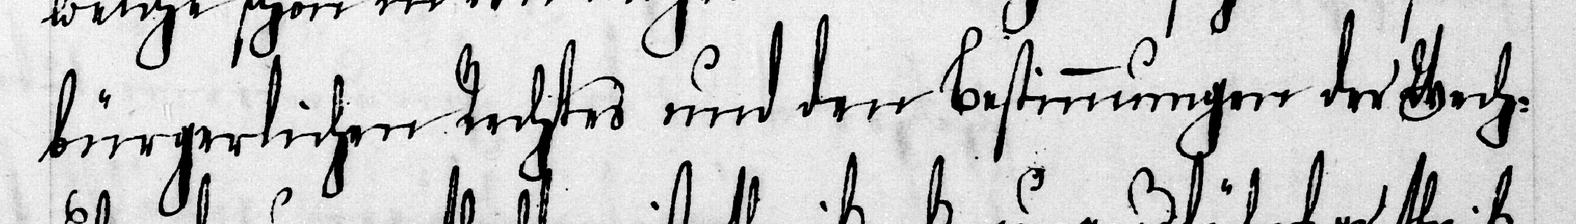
bürgerlichen Rechtes und den Bestimmungen der Wech¬
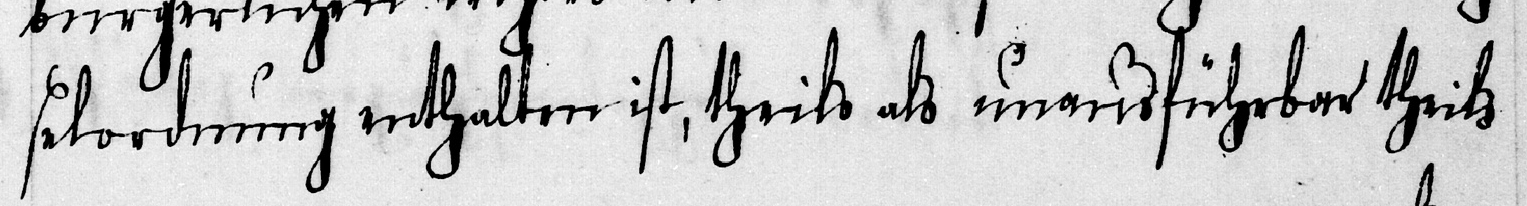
selordnung enthalten ist, theils als unausführbar theils
